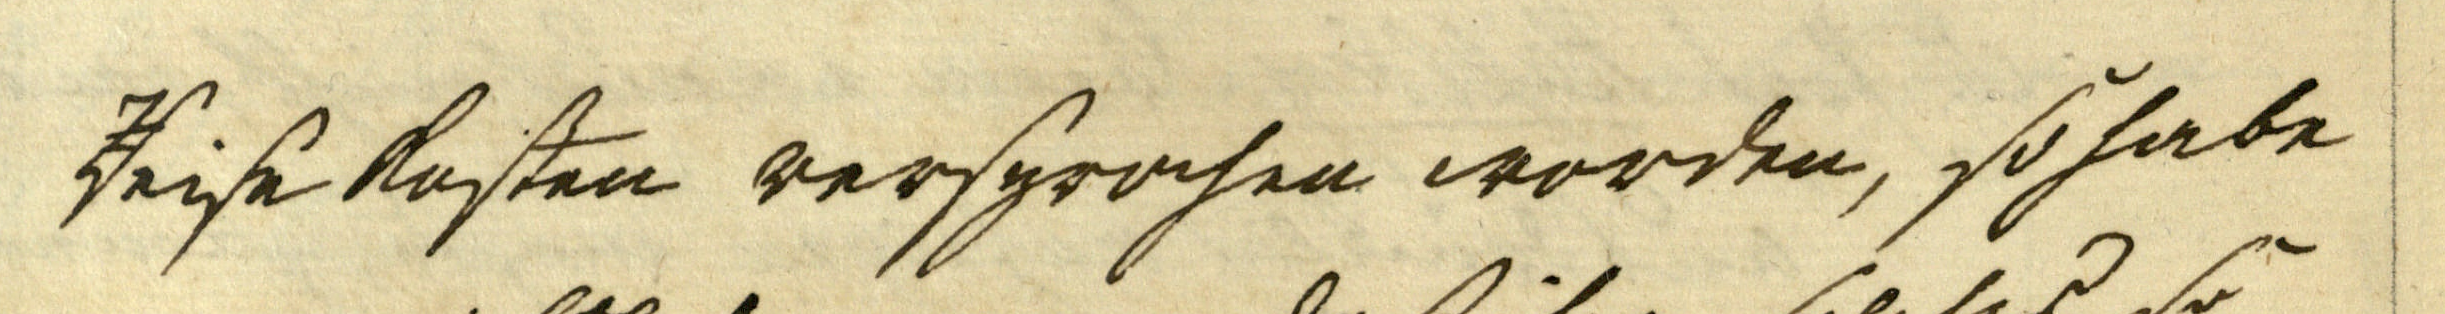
Reise Kosten versprochen worden, so habe
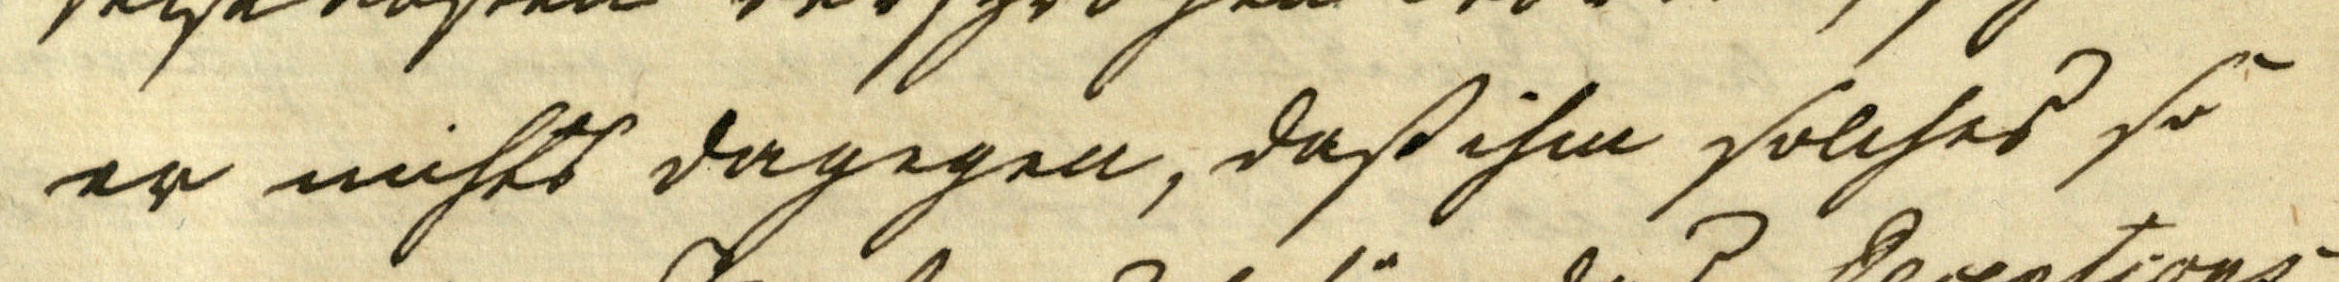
er nichts dagegen, daß ihm solches so
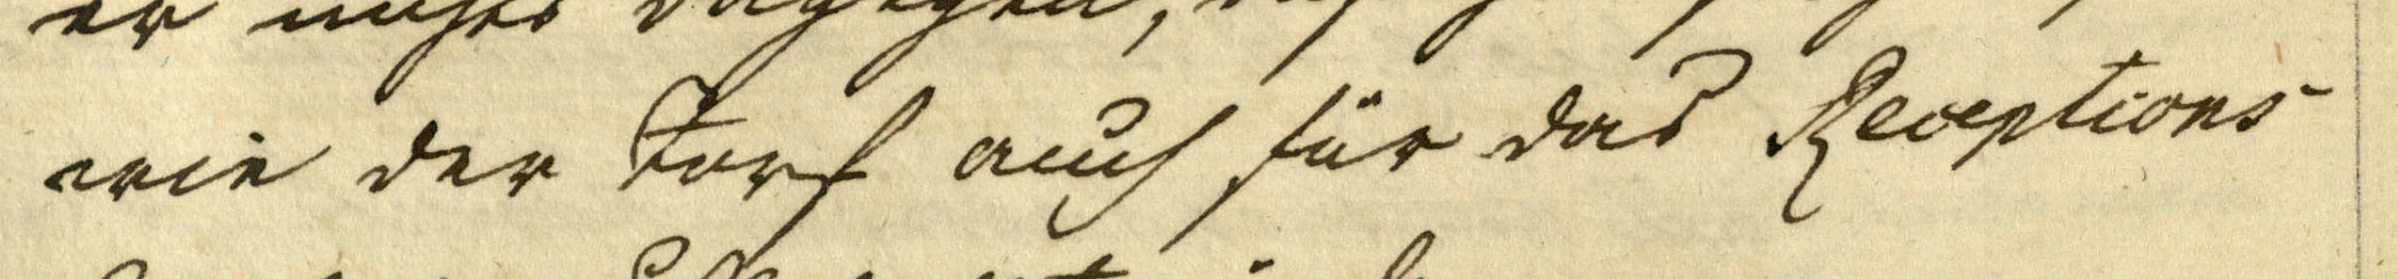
wie der Torf auch für das Receptions
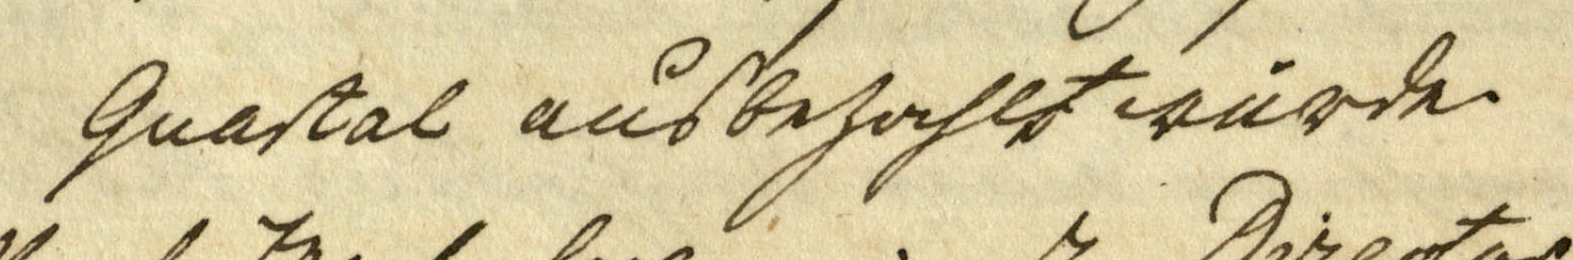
Quartal ausbezahlt würde.
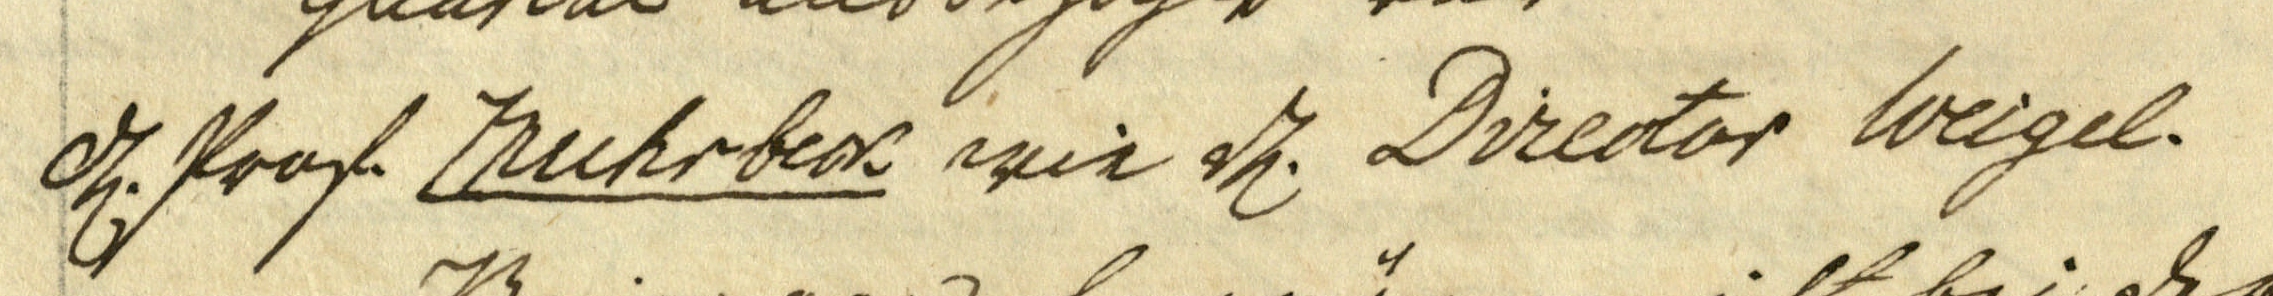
dh. Prof. Muhrbeck wie dh. Director Weigel.
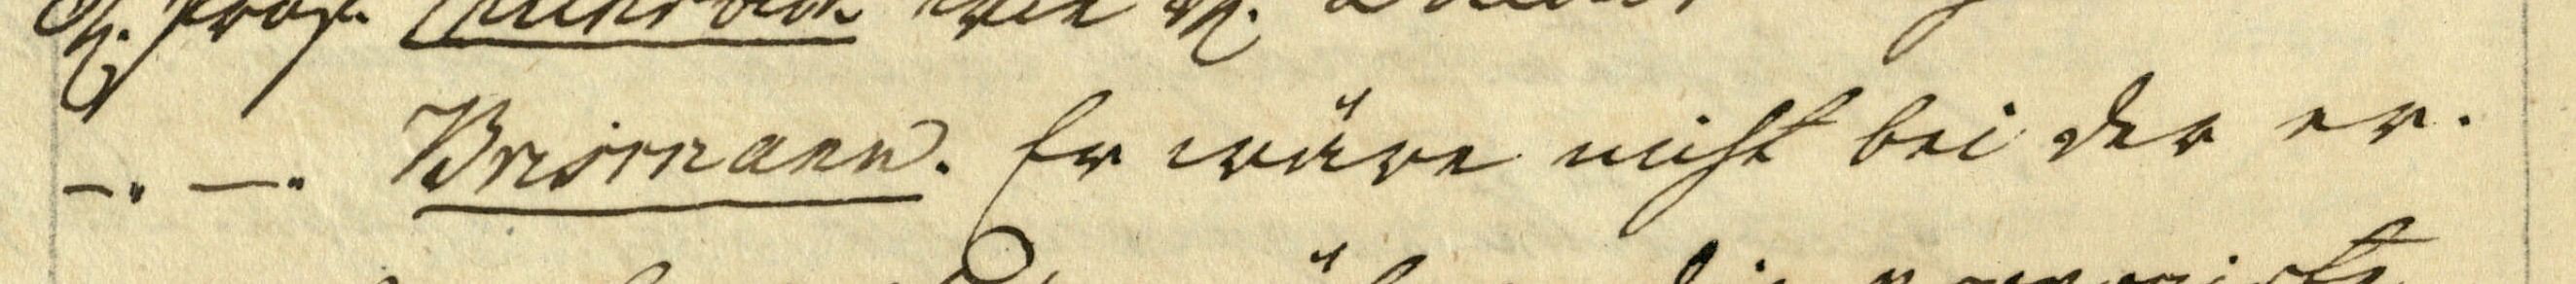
Brismann. Er wäre nicht bei der er¬
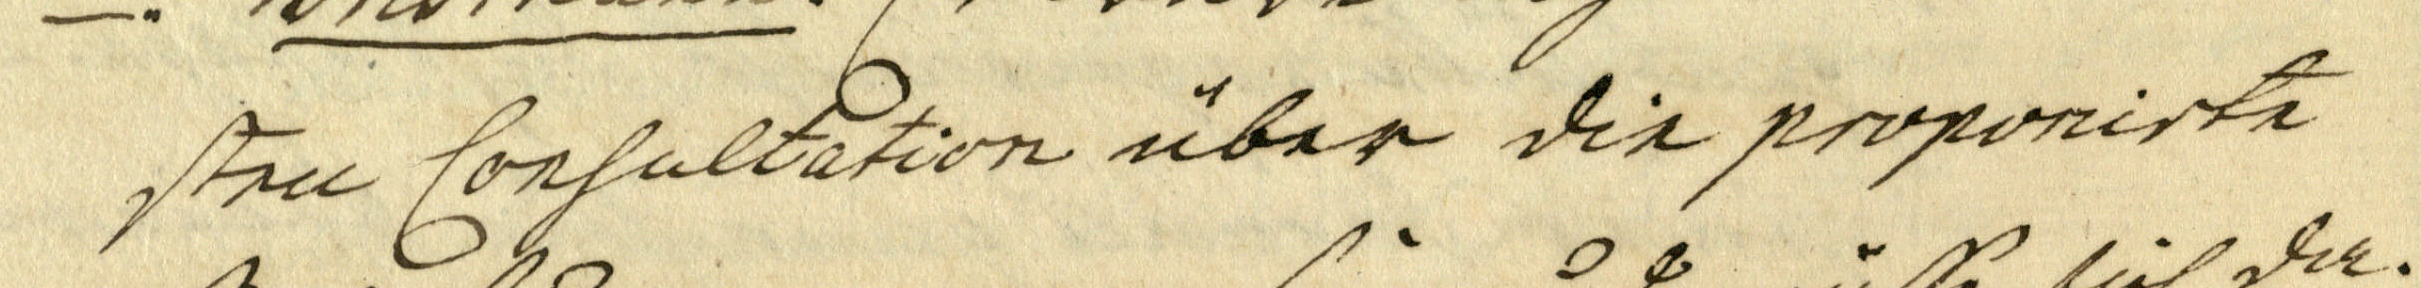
sten Consultation über die proponirte
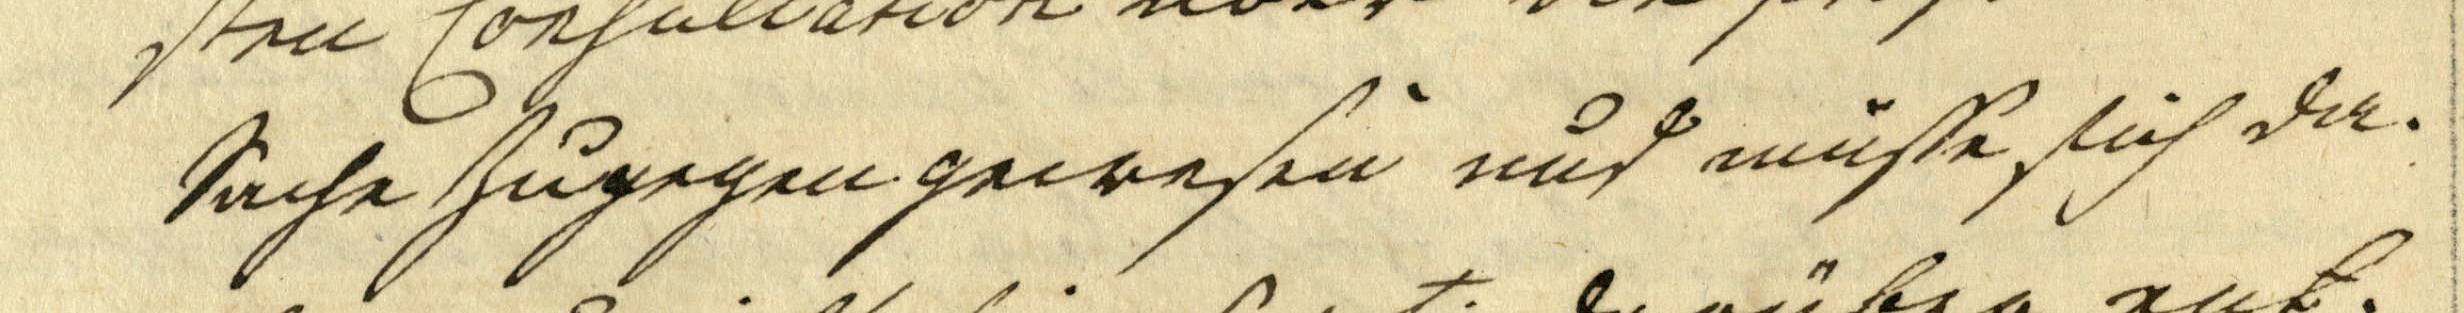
Sache zugegen gewesen und müsse sich da¬
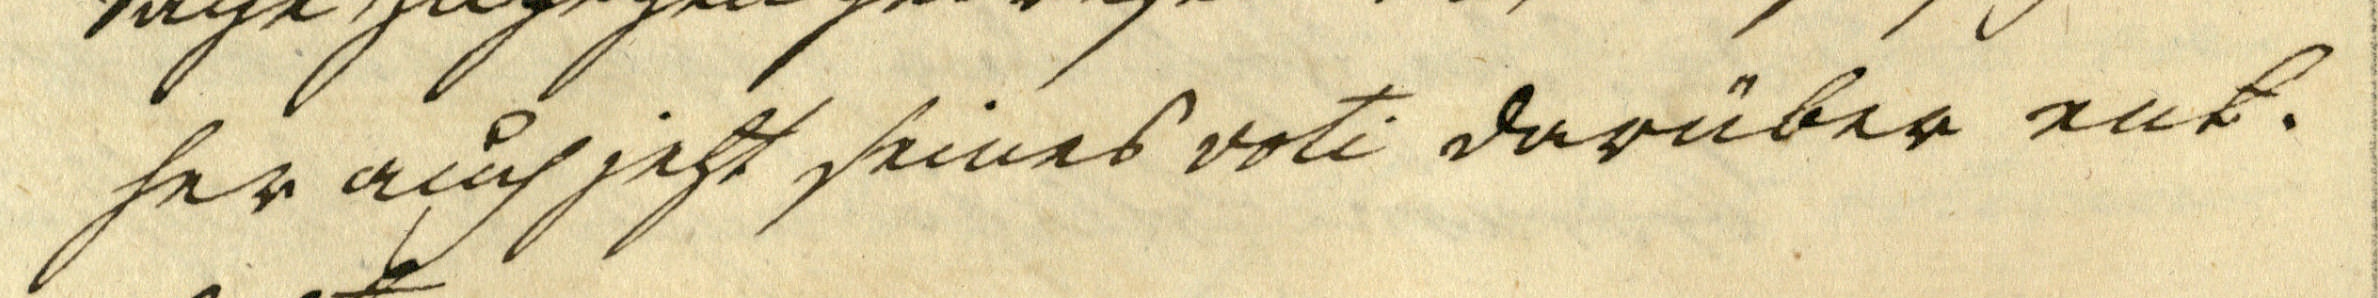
her auch jetzt seines voti darüber ent¬
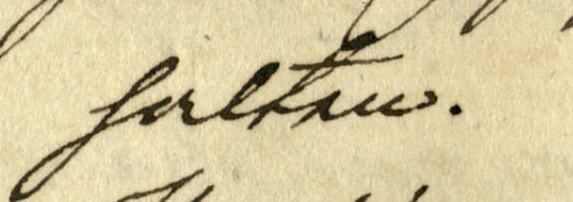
halten.
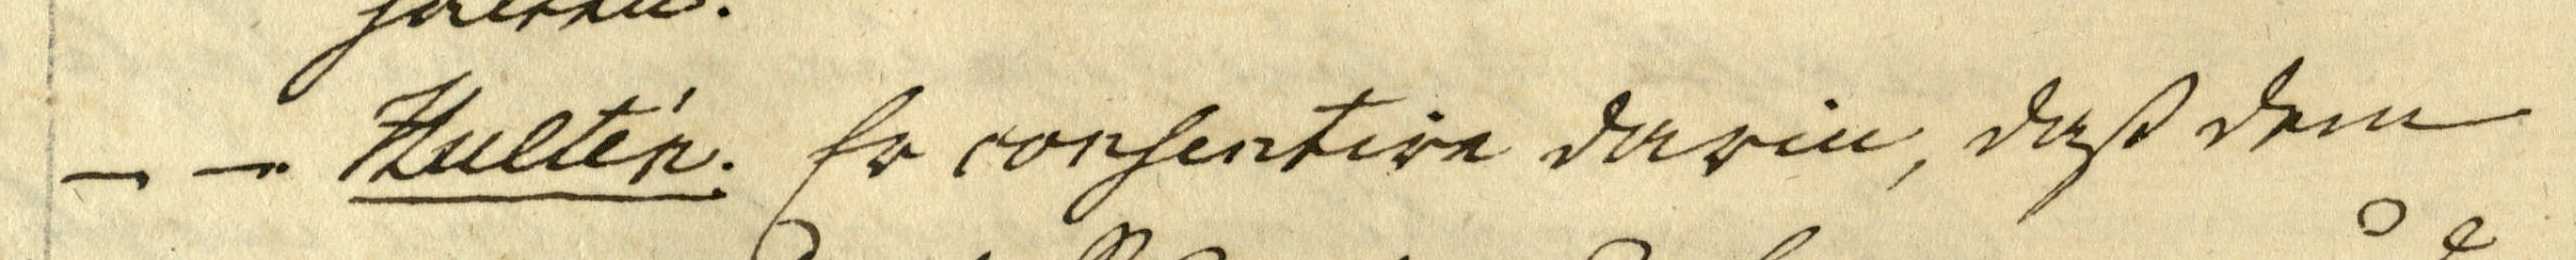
Hultén. Er consentire darin, daß dem
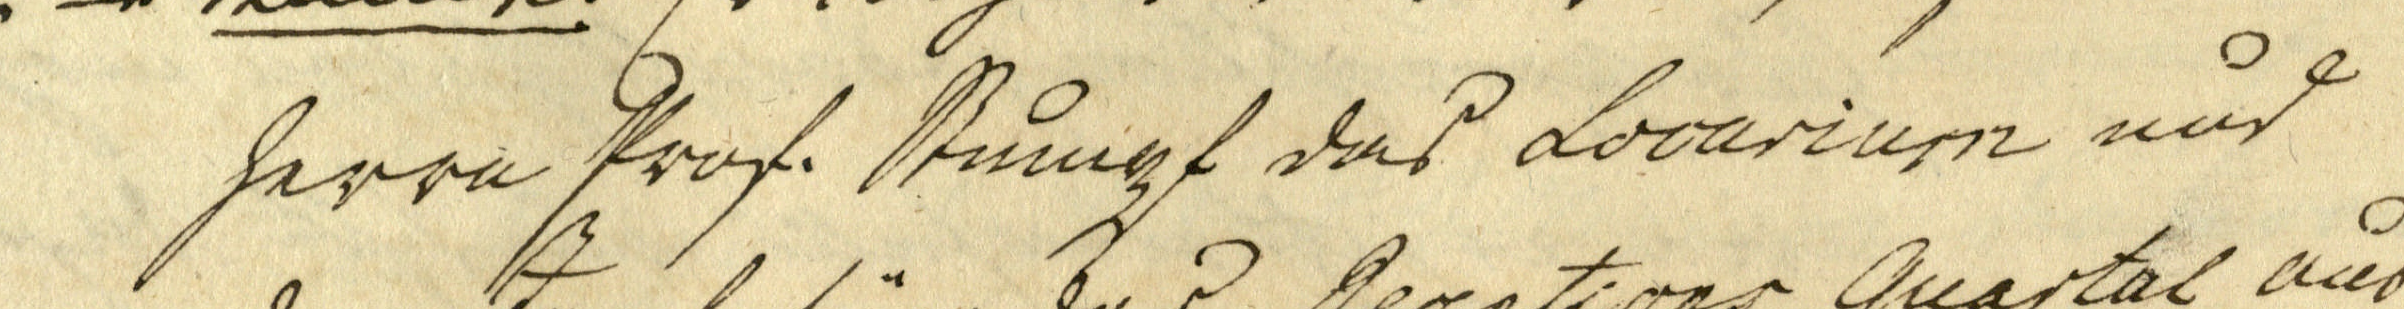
Herrn Prof. Stumpf das Locarium und
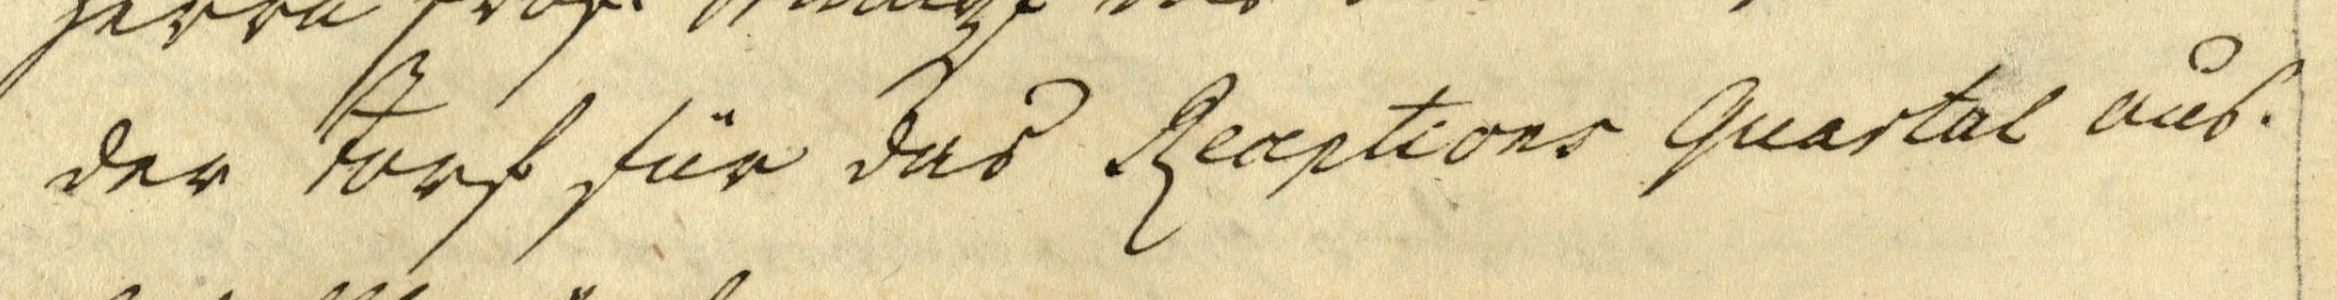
der Torf für das Receptions Quartal aus¬
